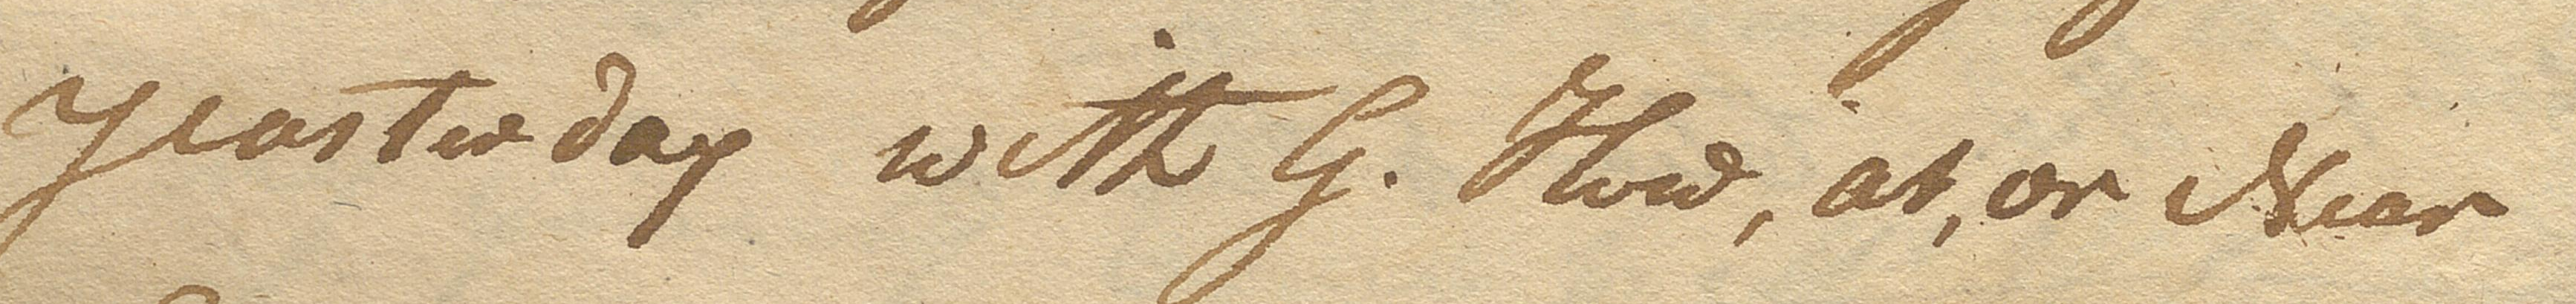yeasterday with G. How, at, or Near
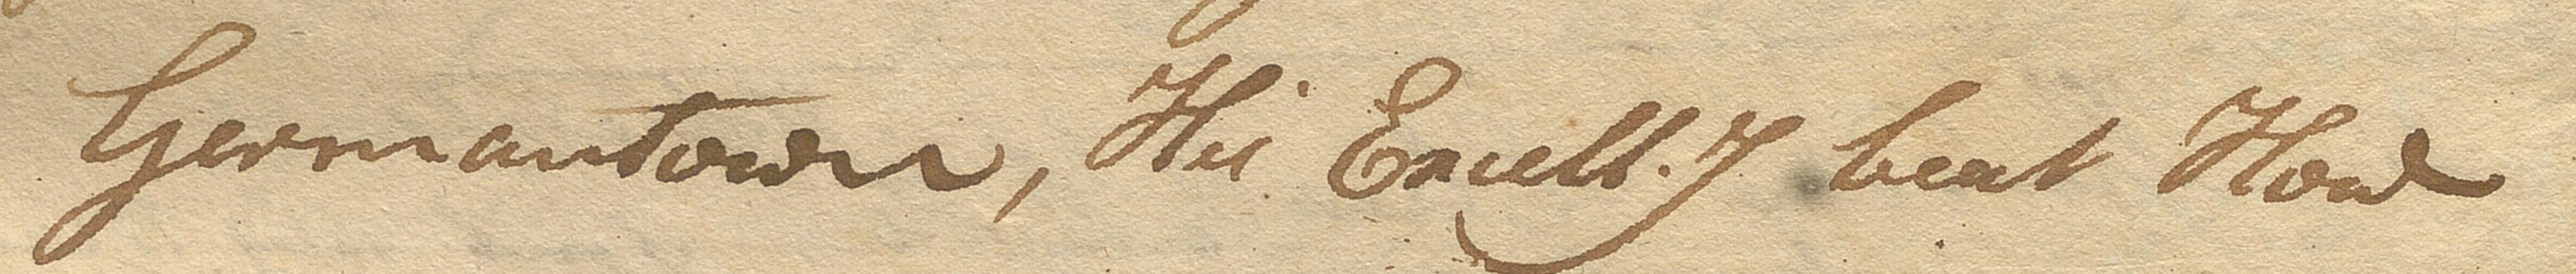Germantown, His Excell^y. beat How
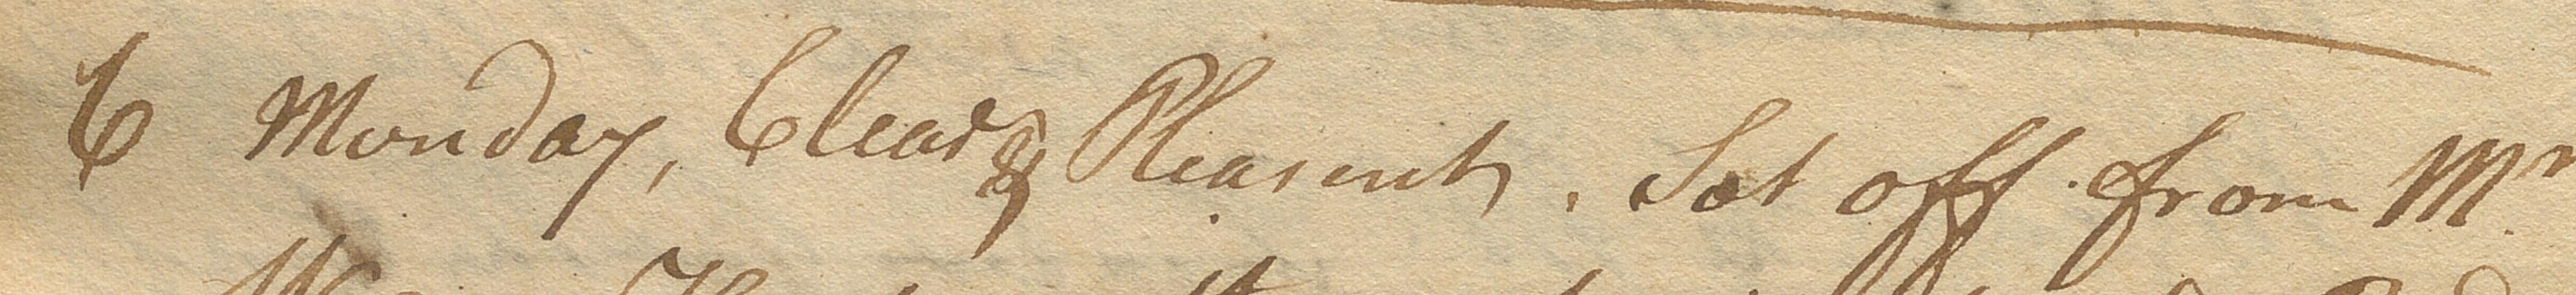6 Monday, Clear & Pleasent, Set off from M^r
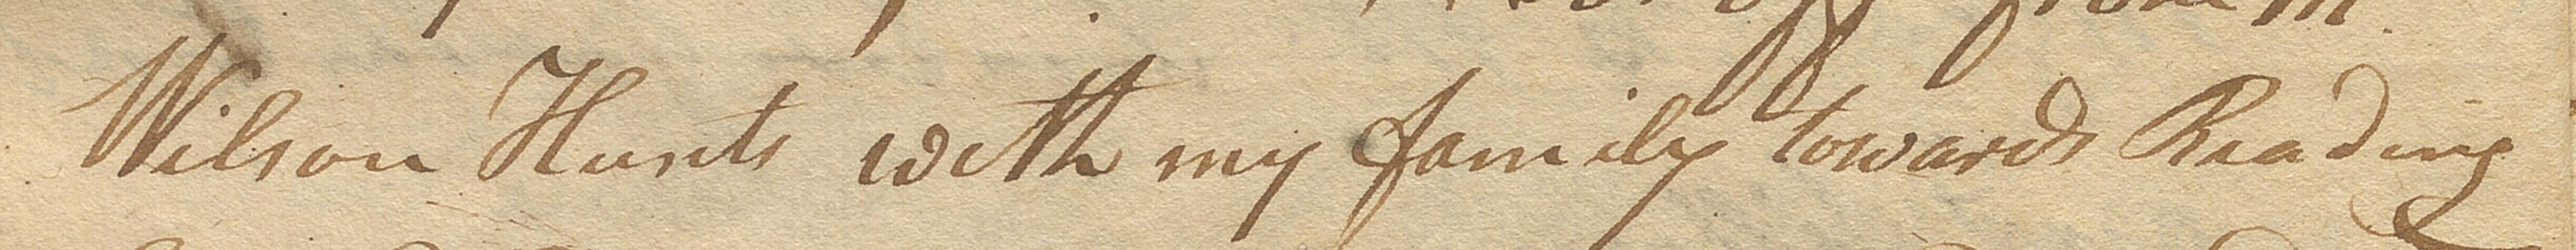Wilson Hunts with my family towards Reading
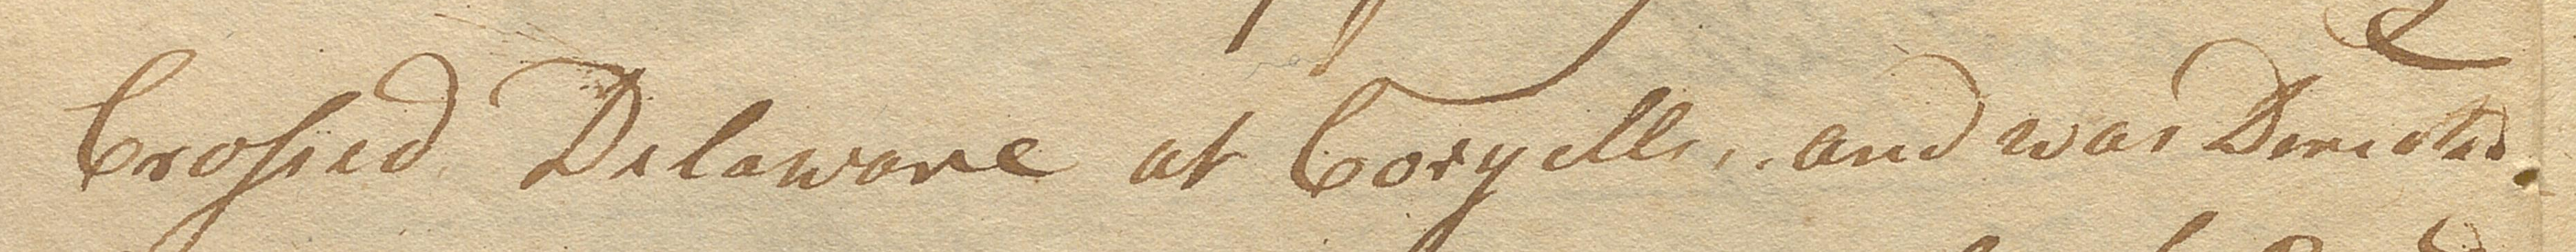Crossed Delaware at Coryells, and was Directed
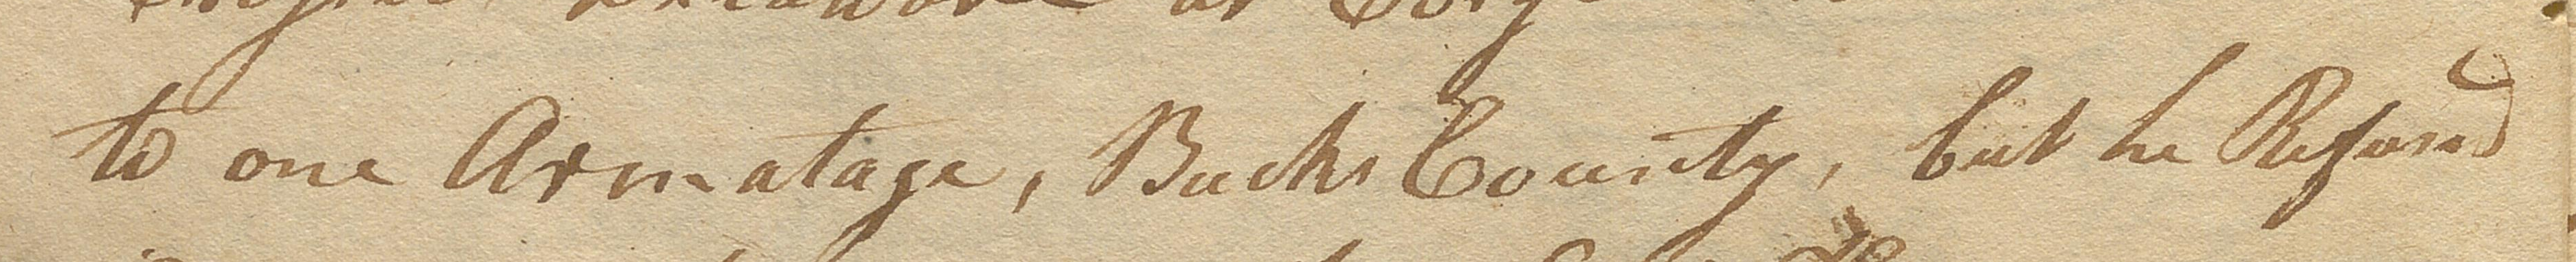to one Armatage, Bucks County, but he Refused
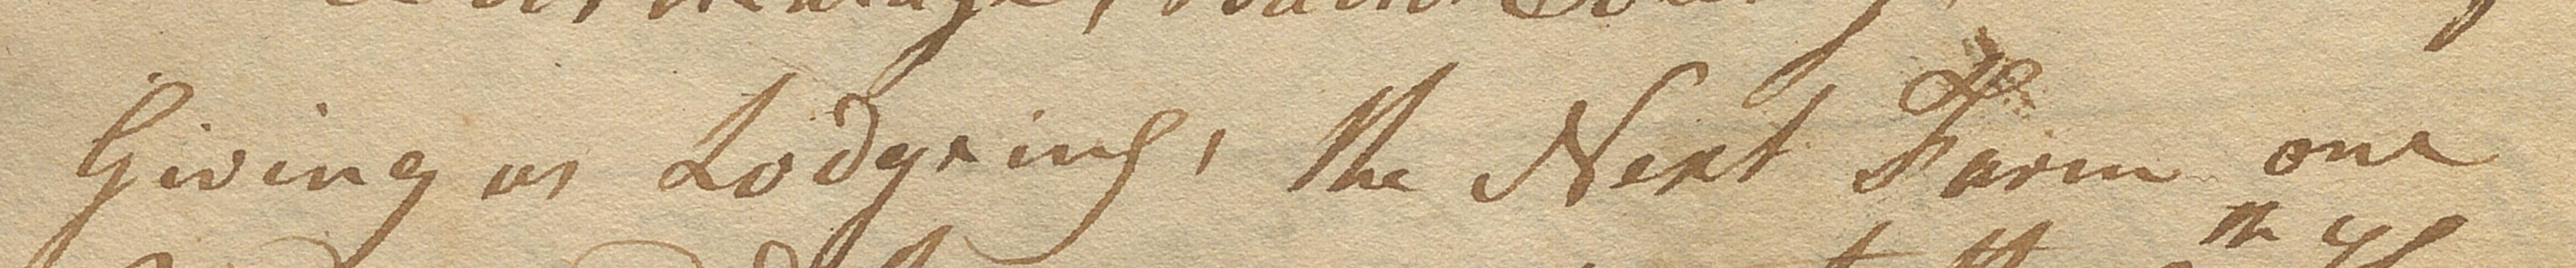Giving as Lodgring, the Next Farm one
